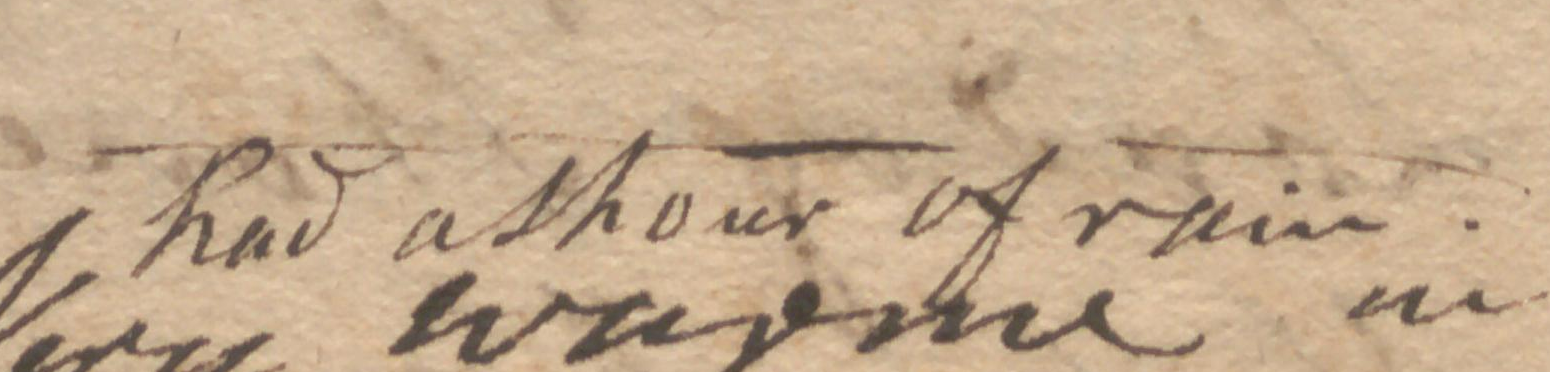had a shour of rain
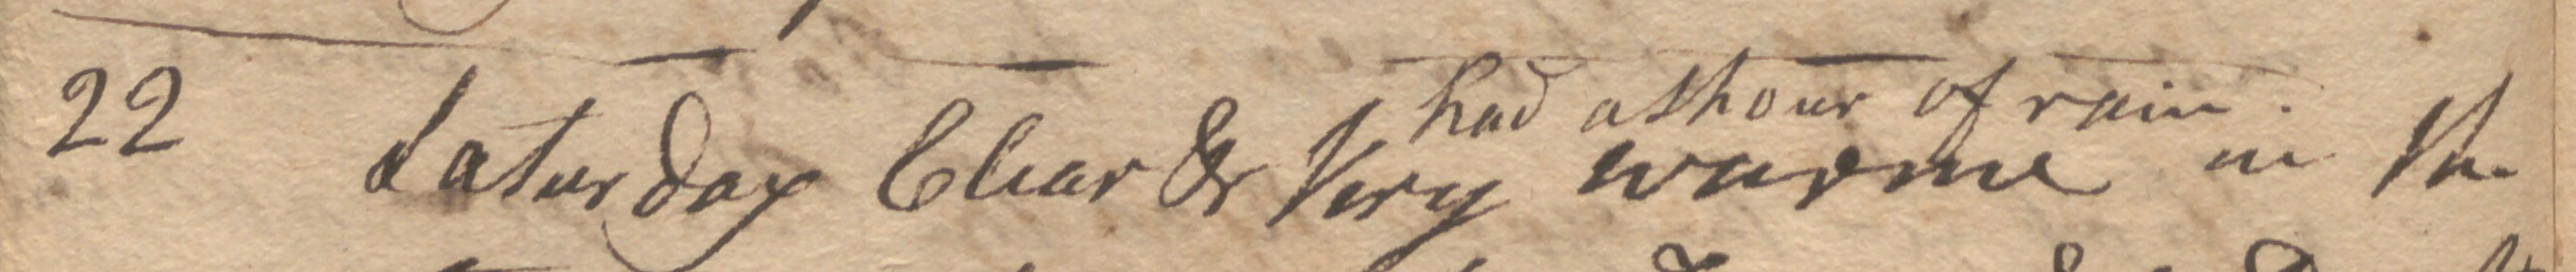22 Saturday Clear & Very warme in the
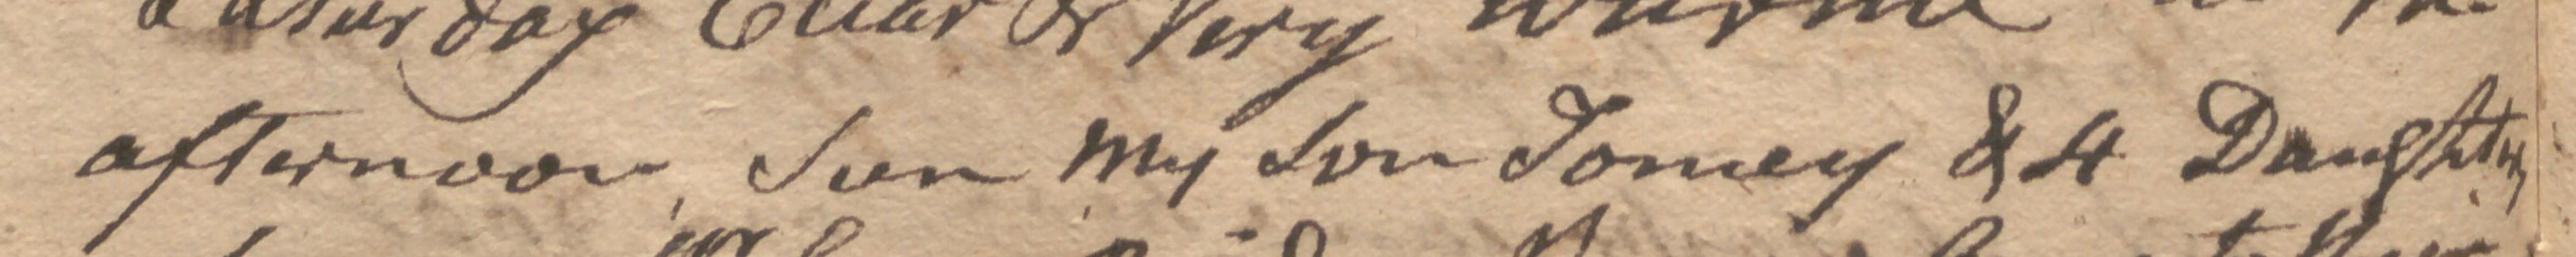afternoon sun my son Tomey & 4 Daughtrs
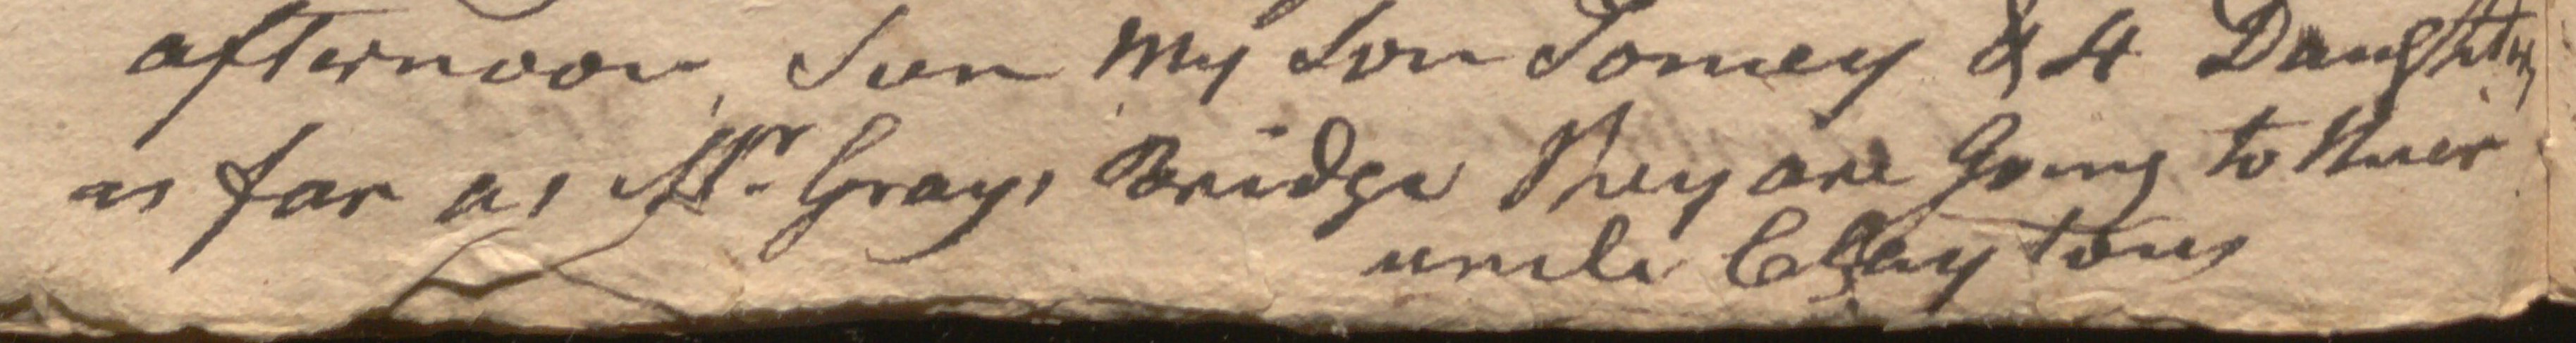as far as M^r. Grays Bridge they are going to their
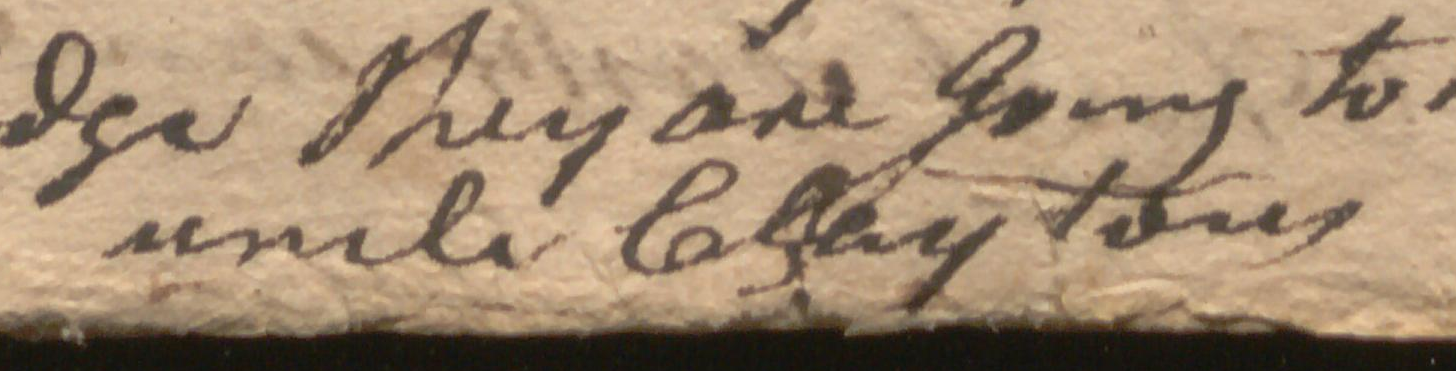uncle Claytons
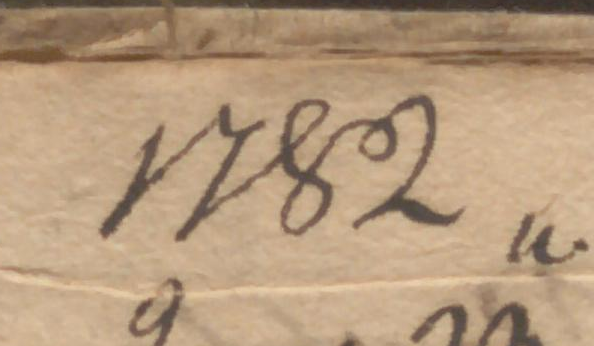1782
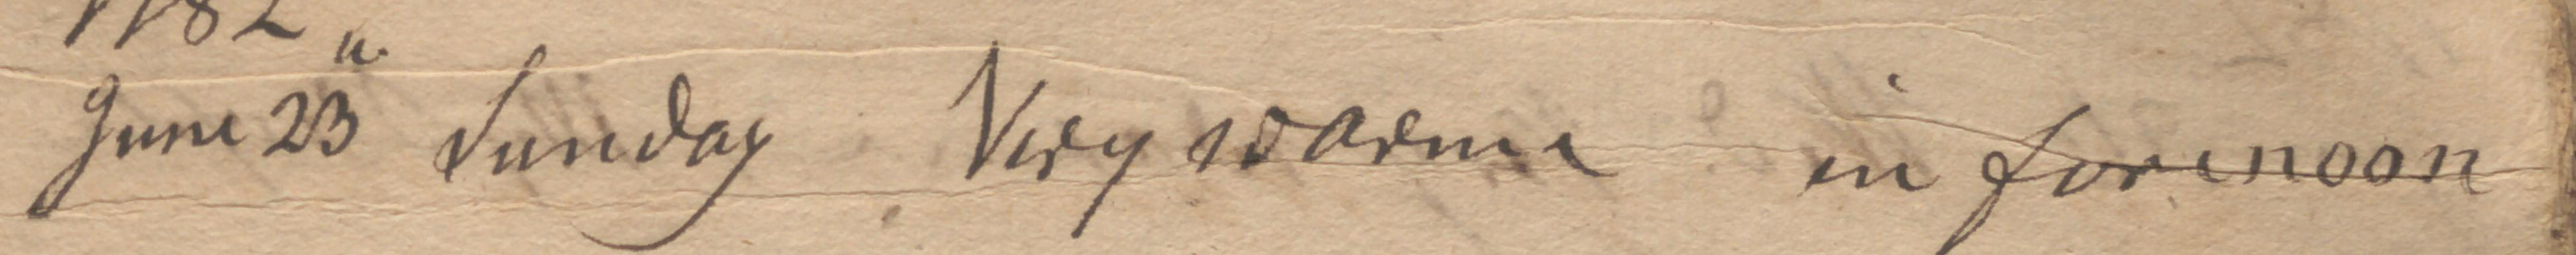June 23^th Sunday Very warme in forenoon
